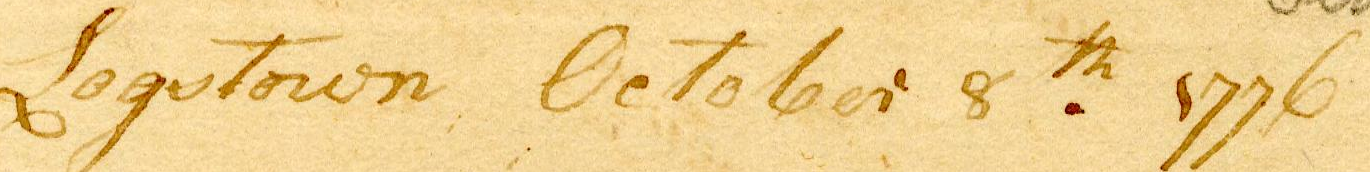Logstown October 8^th. 1776
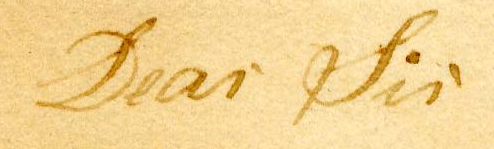Dear Sir
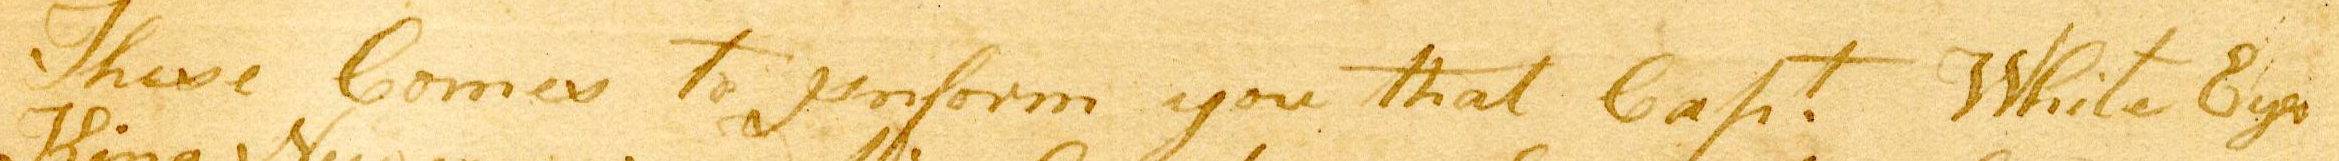These Comes to inform you that Cap^t. White Eyes
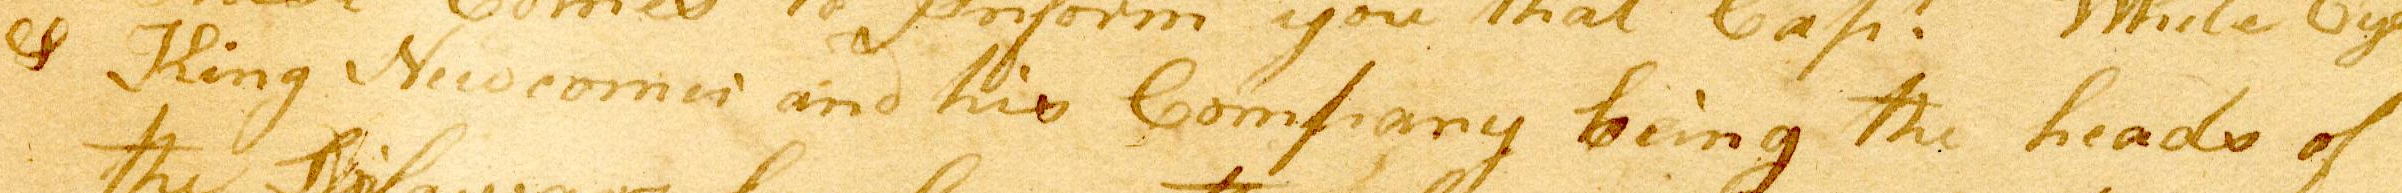& King Newcomer and his Company being the heads of
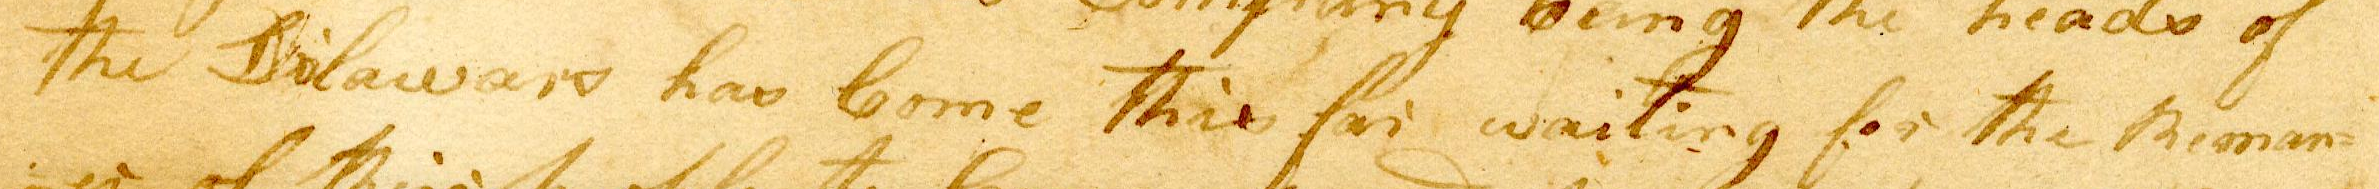the Delaware has Come this for waiting for the Reman-
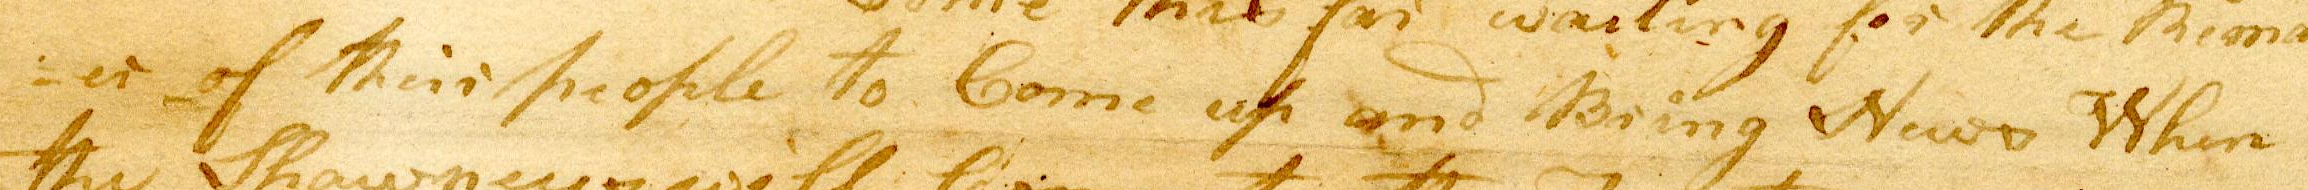-er of their people to Come up and Bring News When
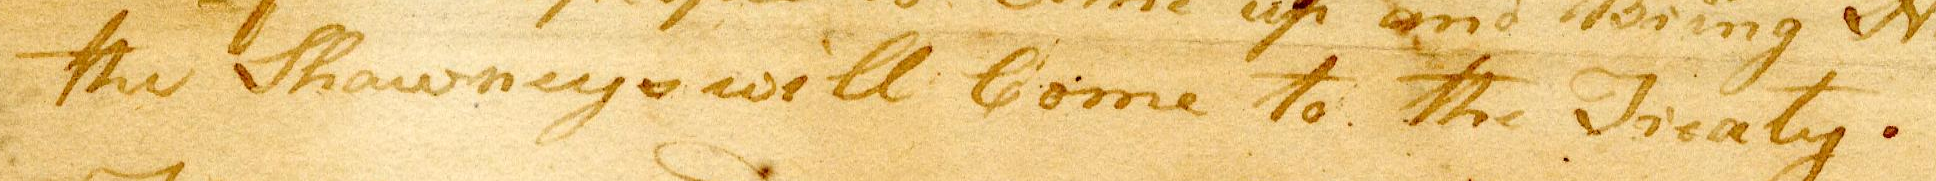the Shawneys will Come to the Treaty.
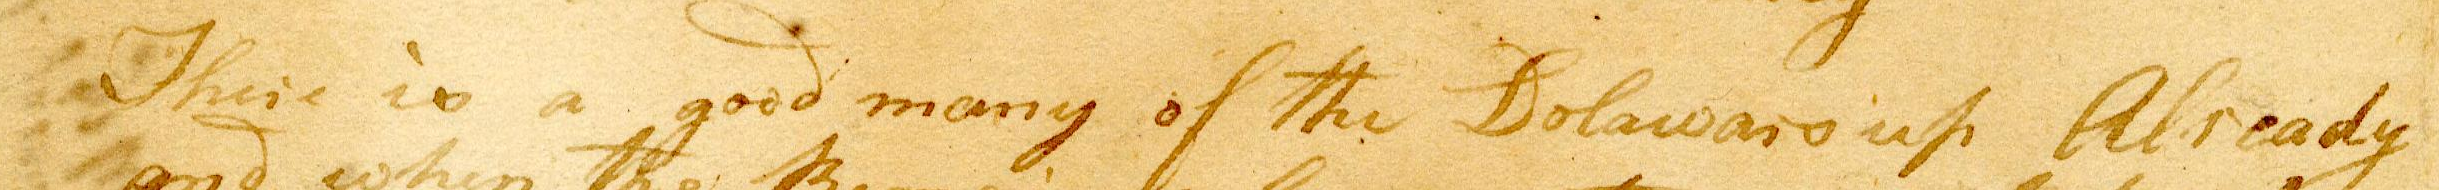There is a good many of the Delawars up Already
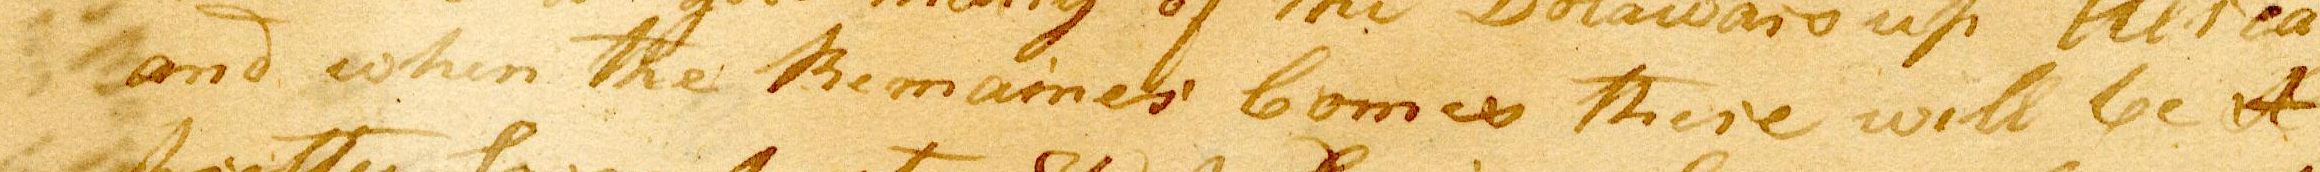and when the Remaines Comes there will be a
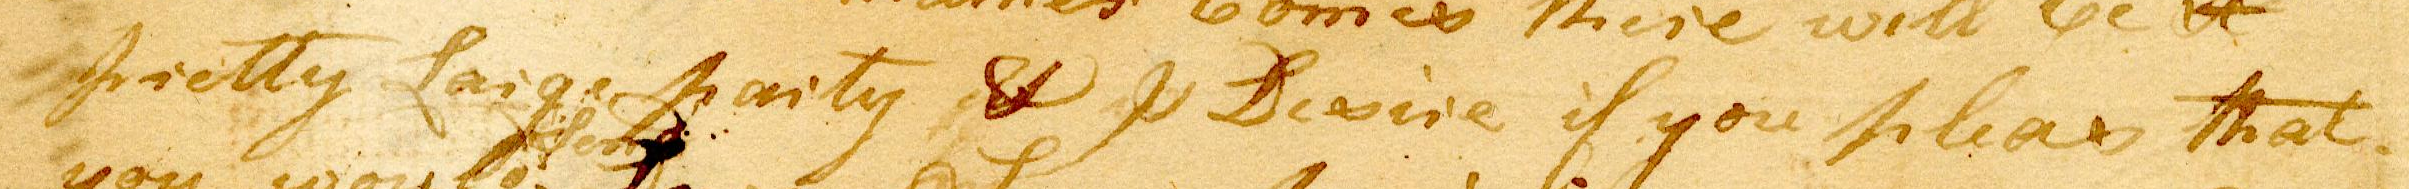pretty Large party & I Desire if you pleas that
